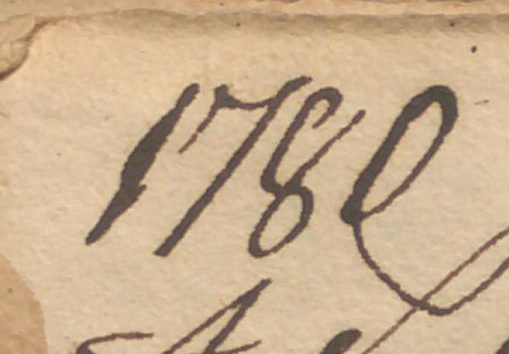1780
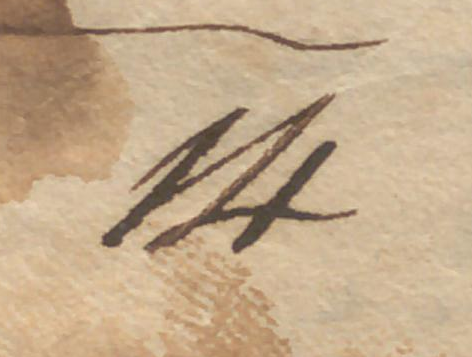14
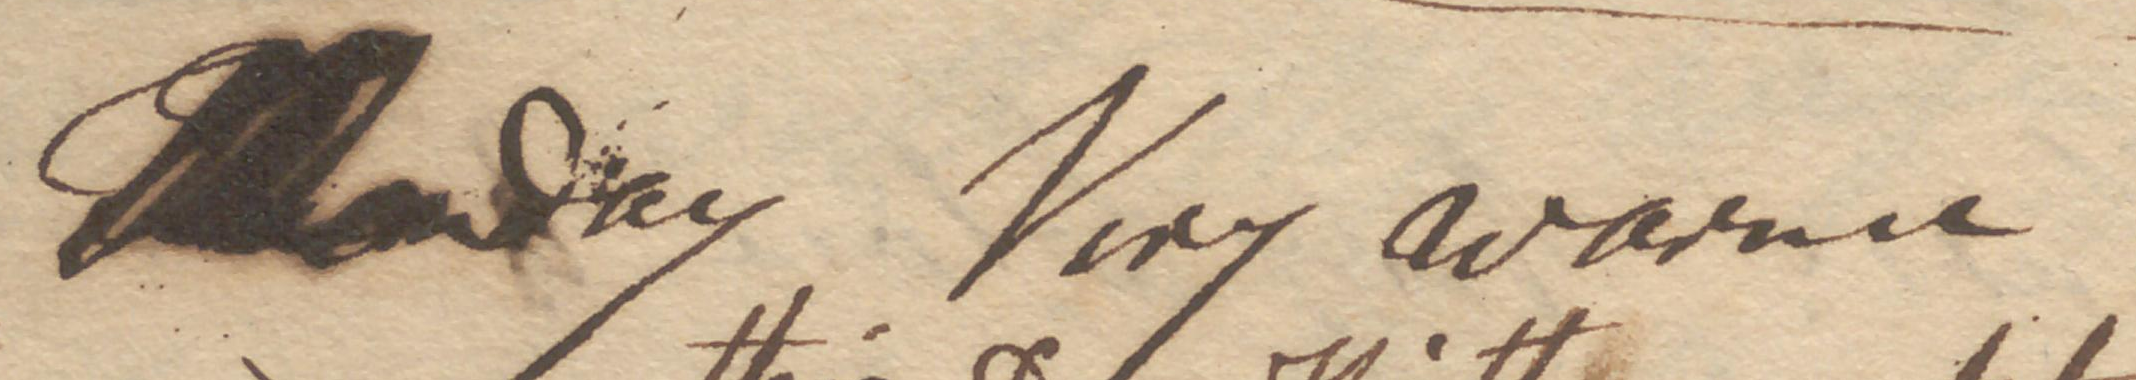Monday Very warme
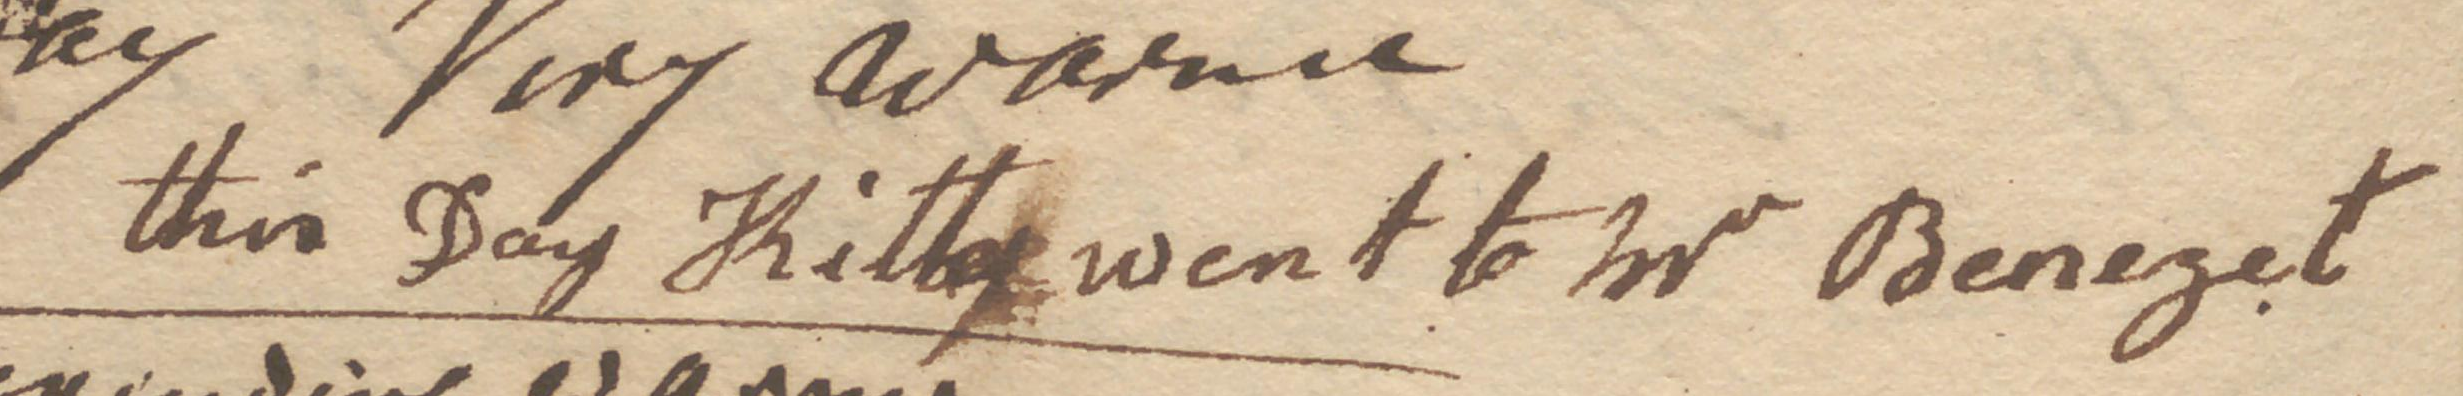this Day Kitty went to M^r Benezet
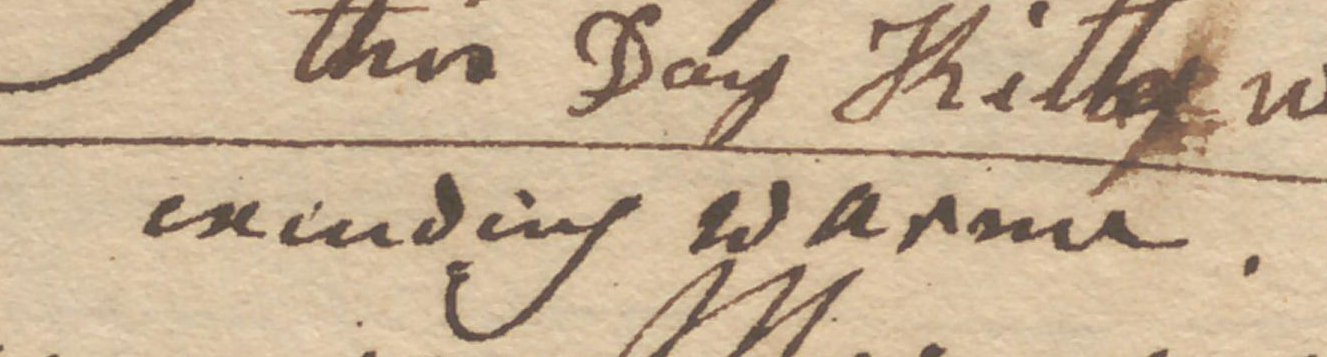exceeding warme
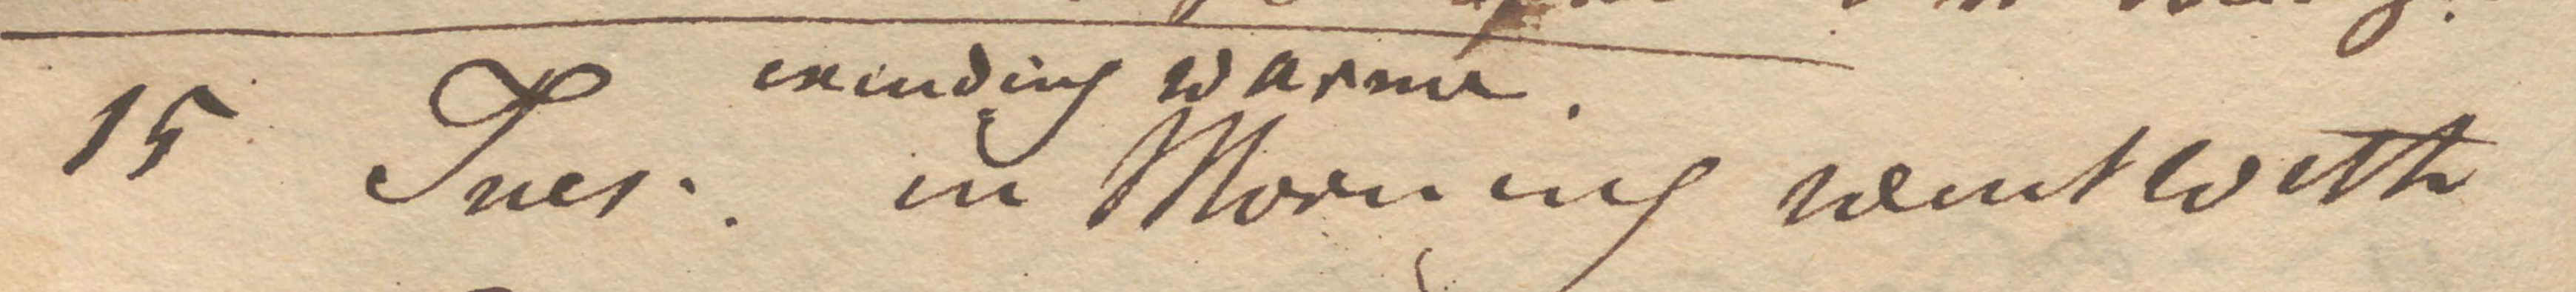15 Tues. in Morning went with
